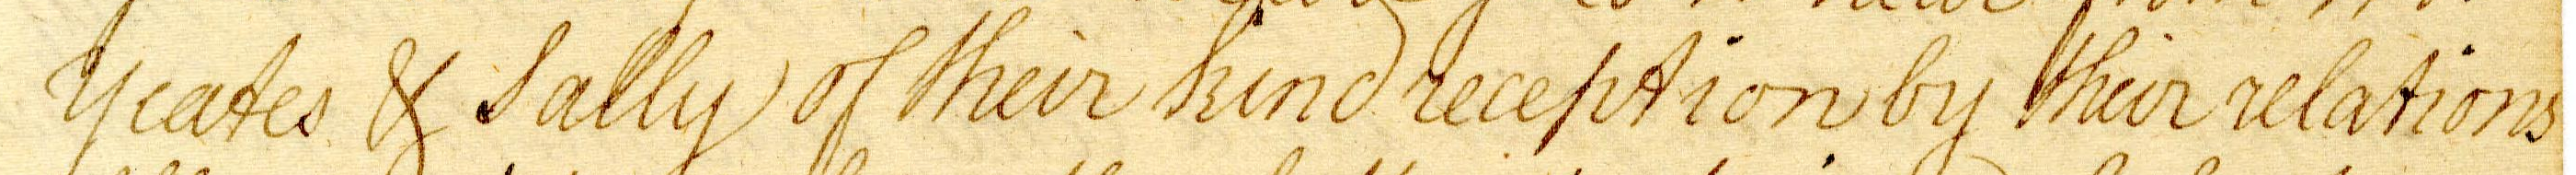Yeates & Sally of their kind reception by their relations
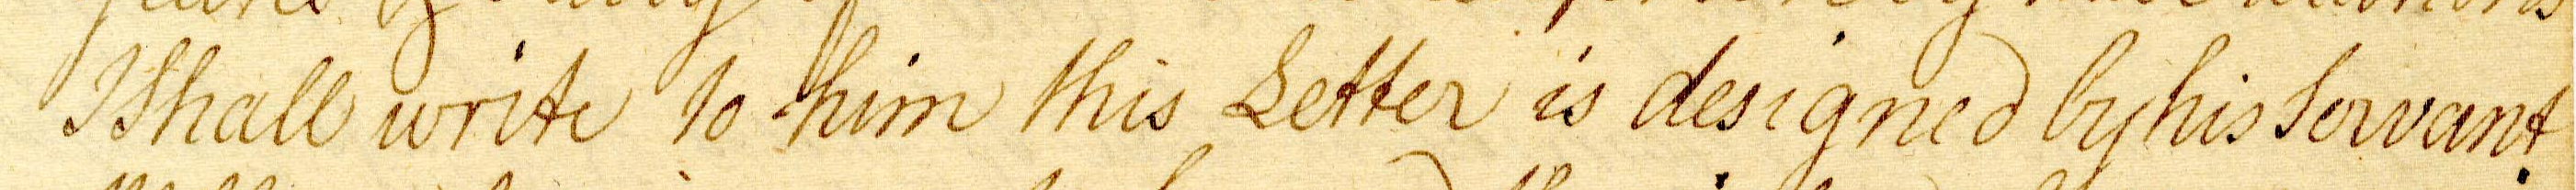I Shall write to him this Letter is designed by his servant
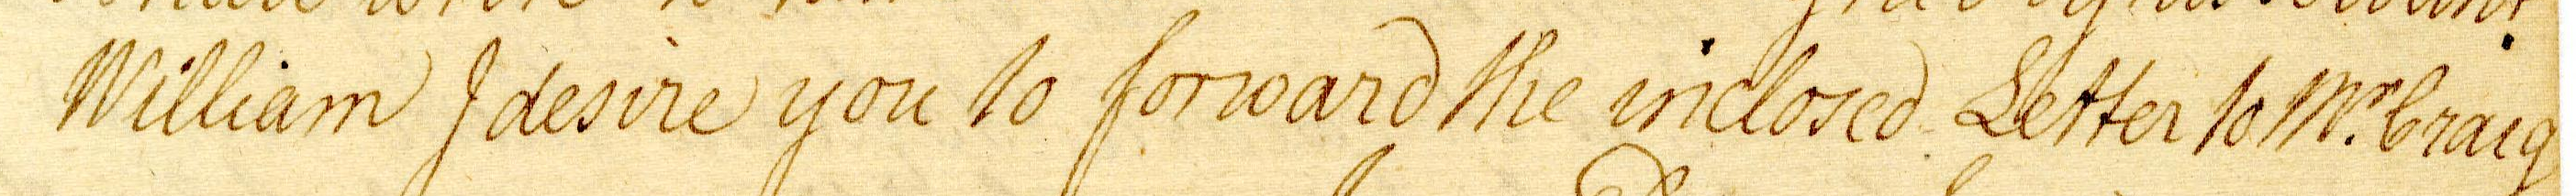William I desire you to forward the inclosed Letter to M^r. Craig
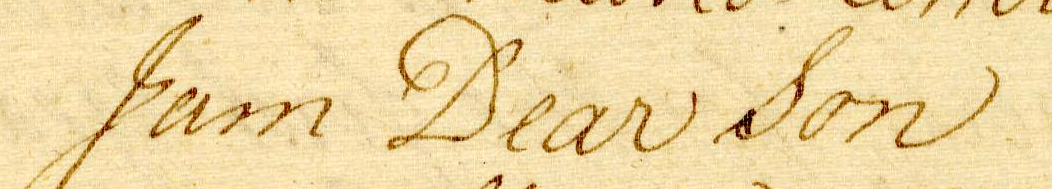I am Dear Son
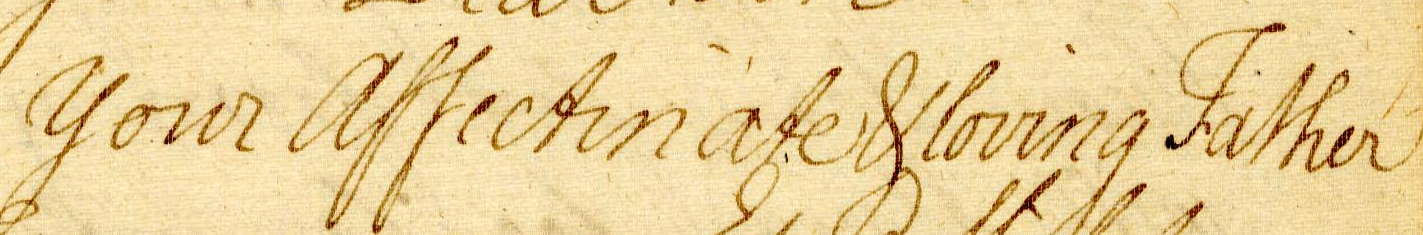Your Affectionate & loving Father
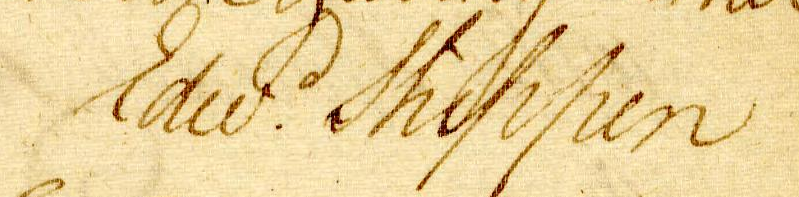Edw^d. Shippen
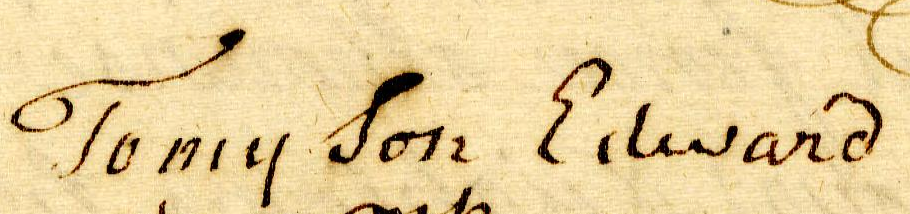To my Son Edward
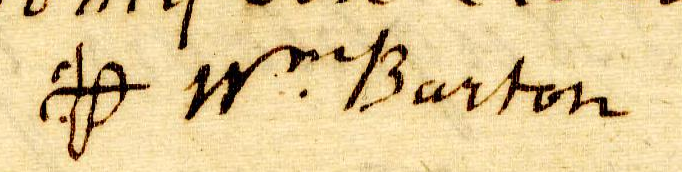per W^m. Barton
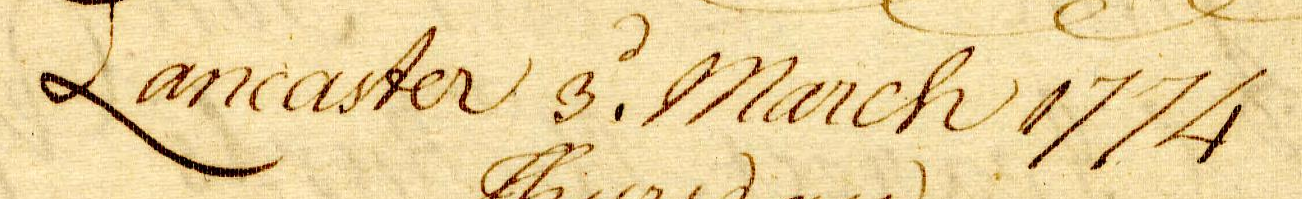Lancaster 3^d. March 1774
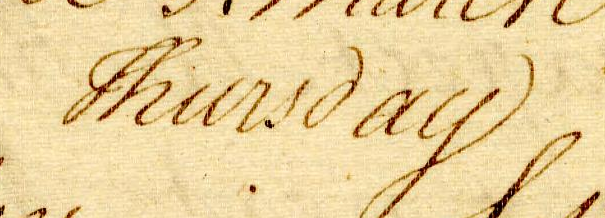Thursday
